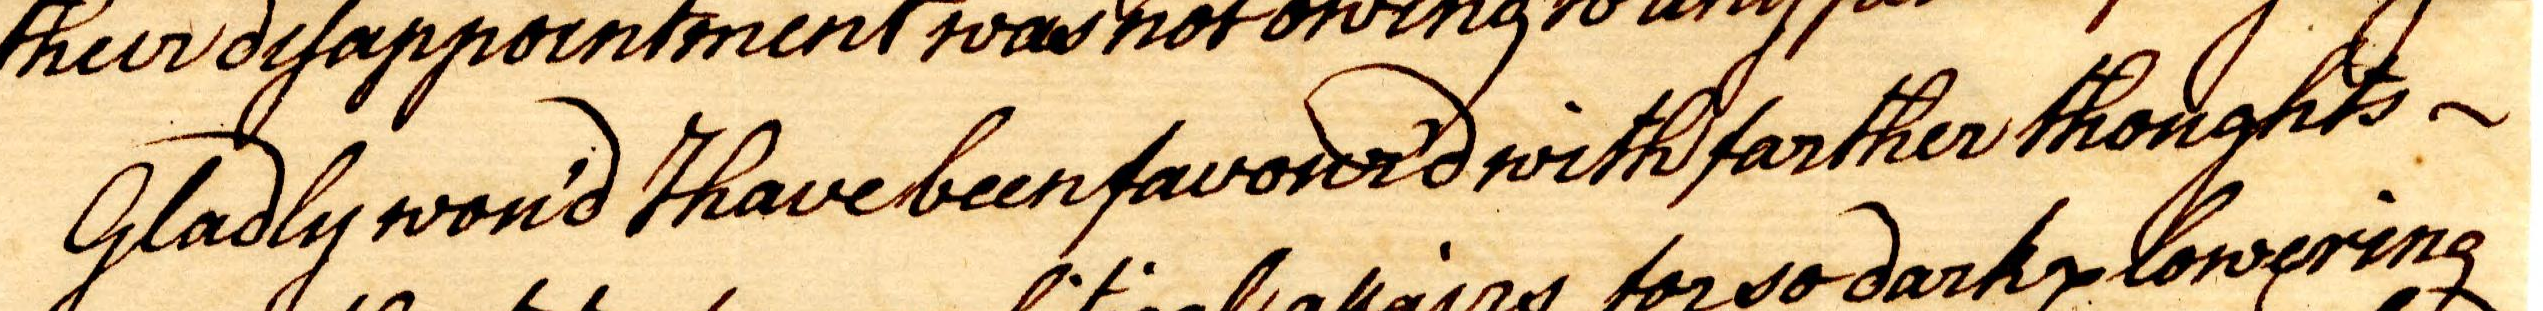Gladly won'd I have been favour'd with farther thoughts-
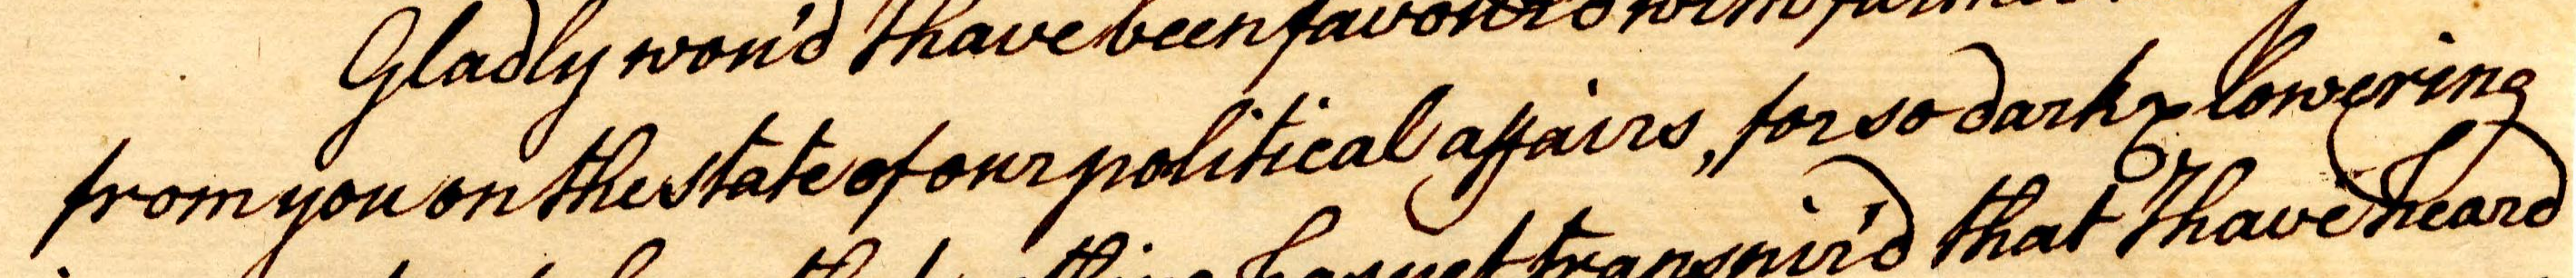from you on the state of our political affairs, for so dark & lowering
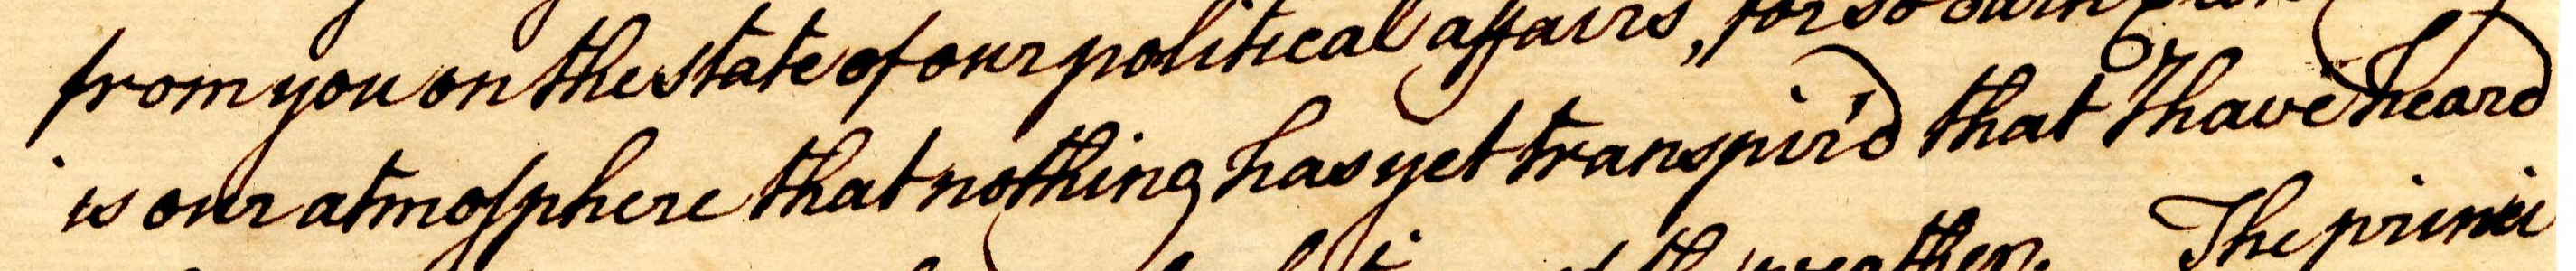is our atmosphere that nothing has yet transpir'd that I have heard
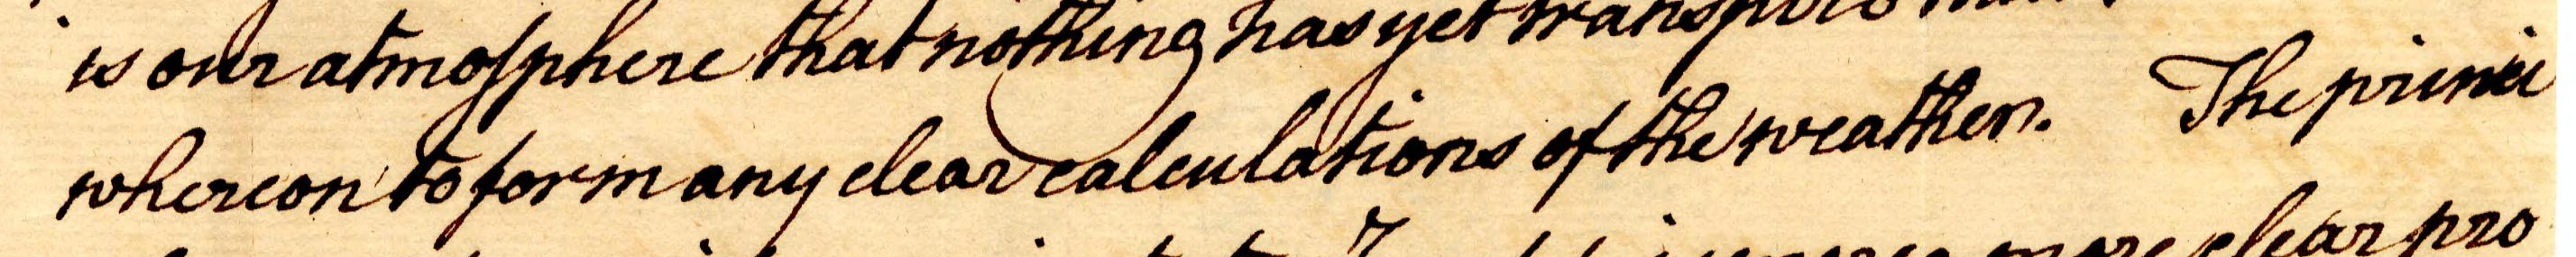whereon to form any clear calculations of the weather. The princi
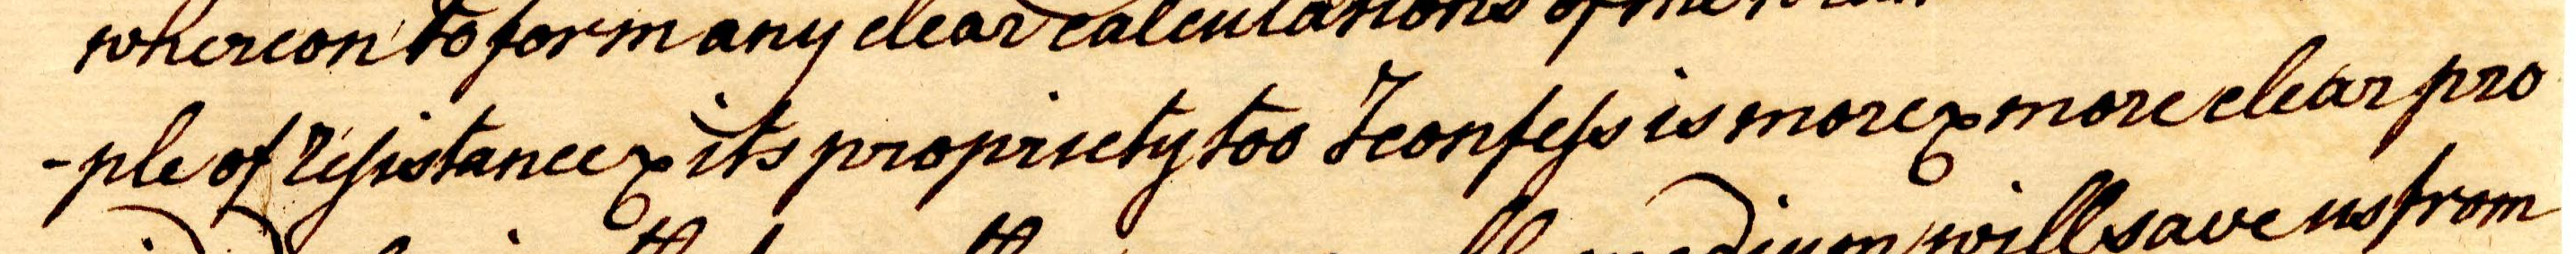-ple of resistance, its propriety too I confess is more & more clear pro
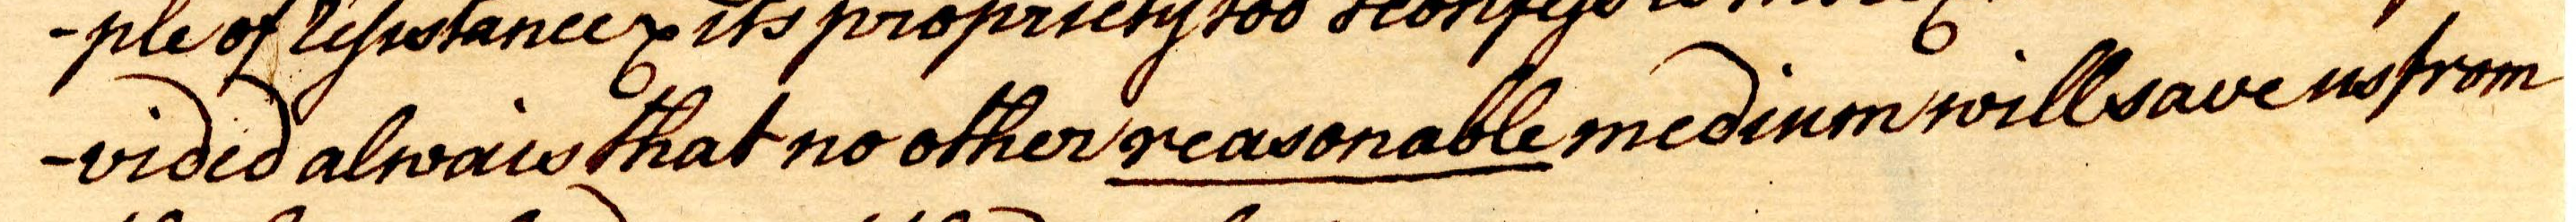-vided alwais that no other reasonable medium will save us from
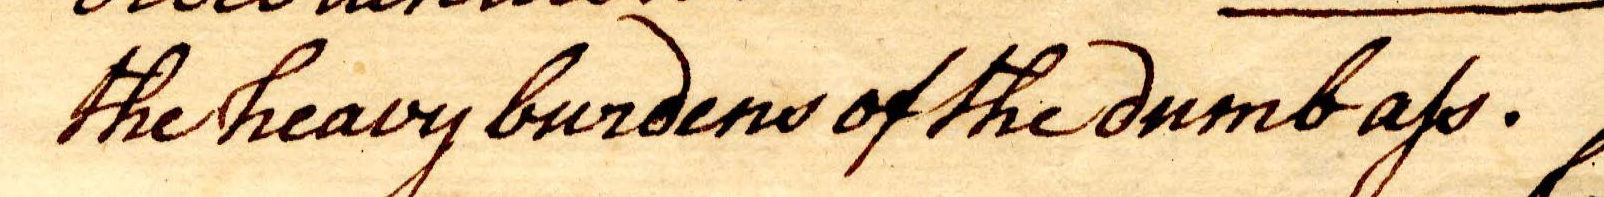the heavy burdens of the dumb ass.
